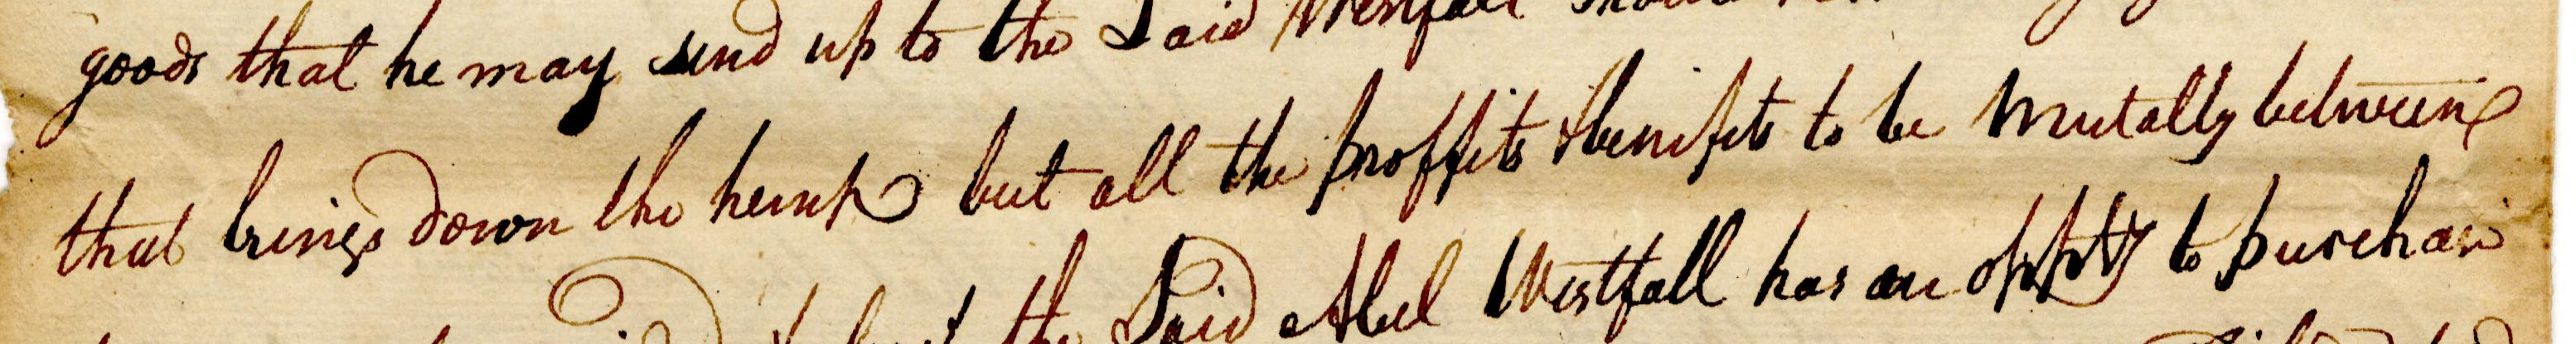that brings down the hemp but all the the proffits therefor to be mutually between'
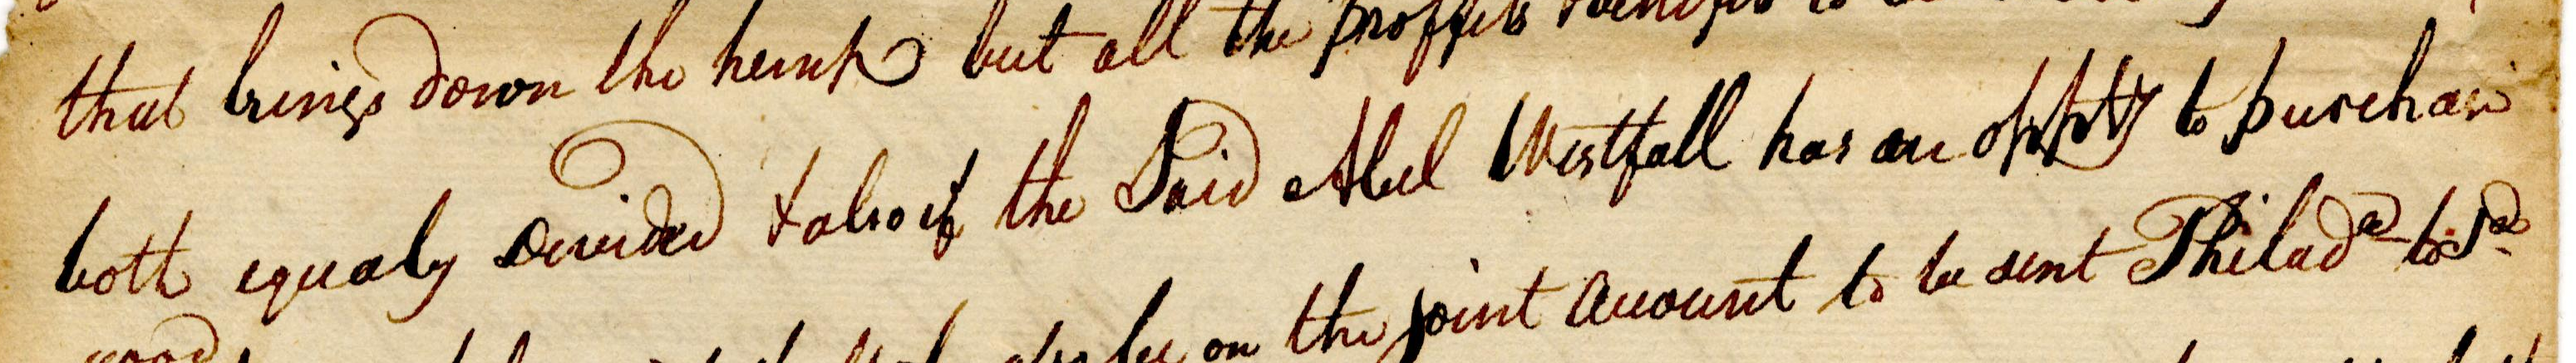both equaly divided & all of the Said Abel Westfall has an opp^ty to purchase
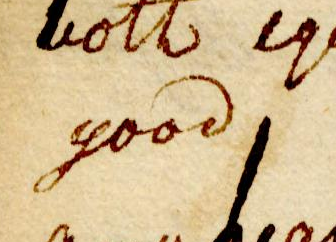good
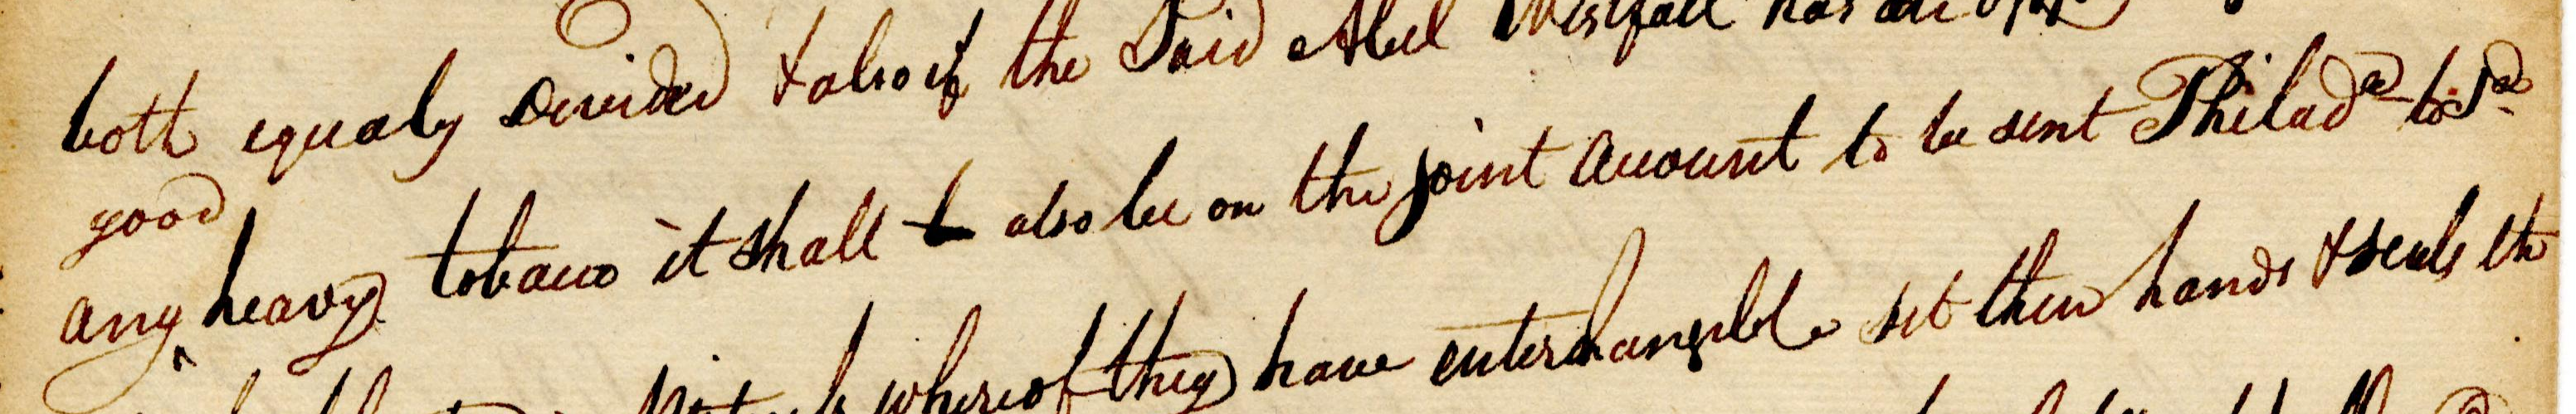any heavy tobacco it shall also be on the joint account to be sent Philad^a. tod^da
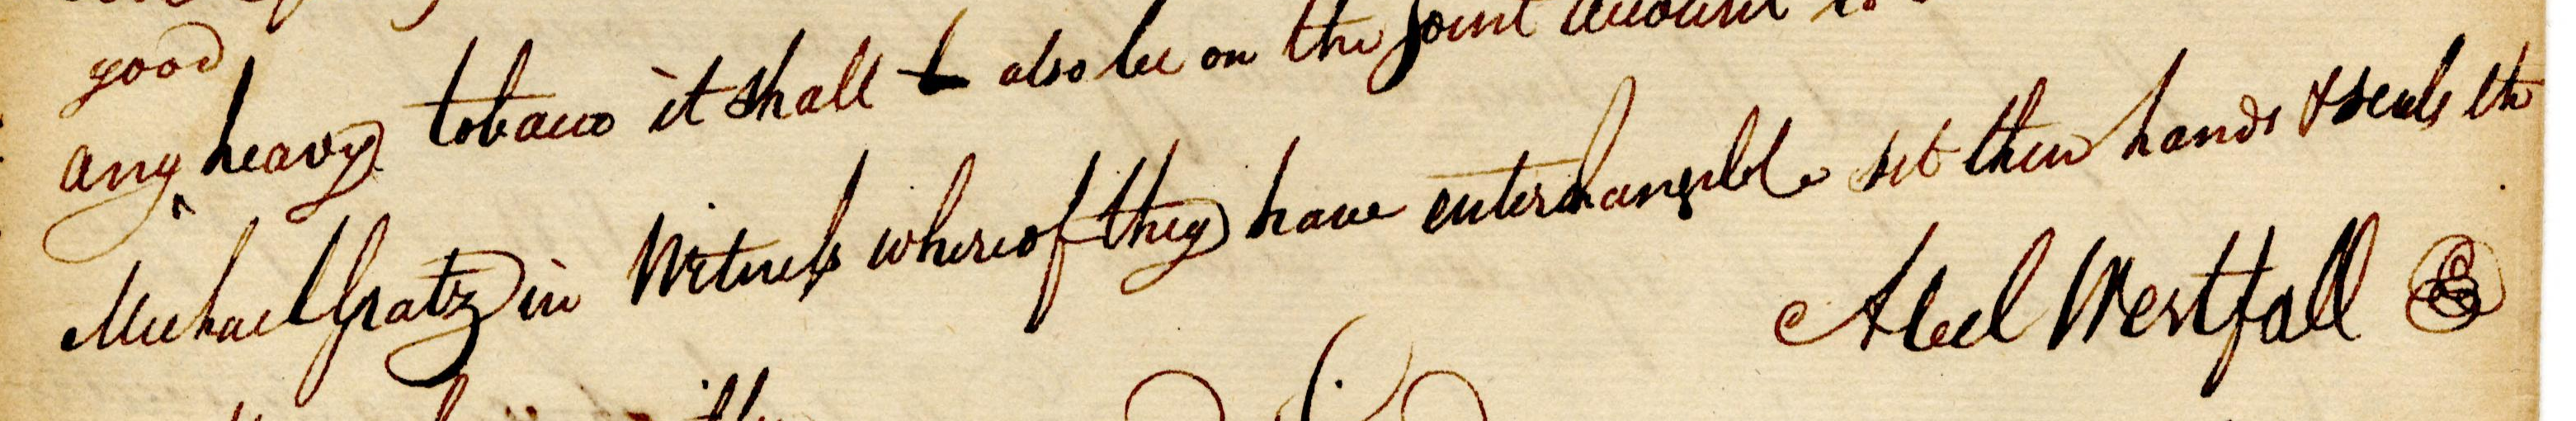Michael Gratz in Witness whereof they have enterchangeble set there hands & seals at
